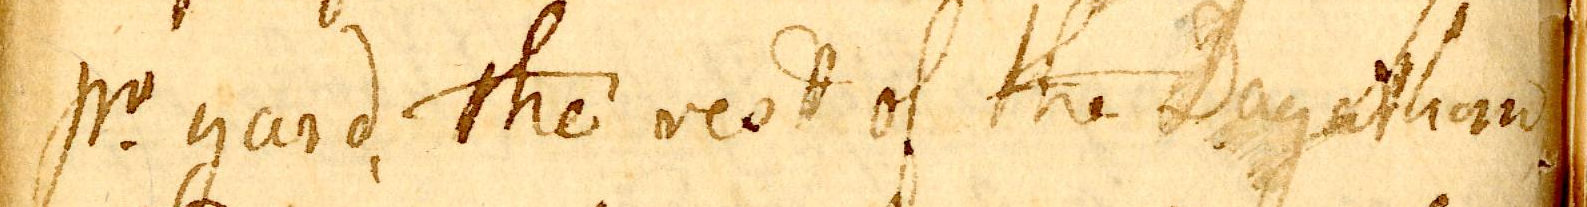p^r yard, the rest of the Day at hom
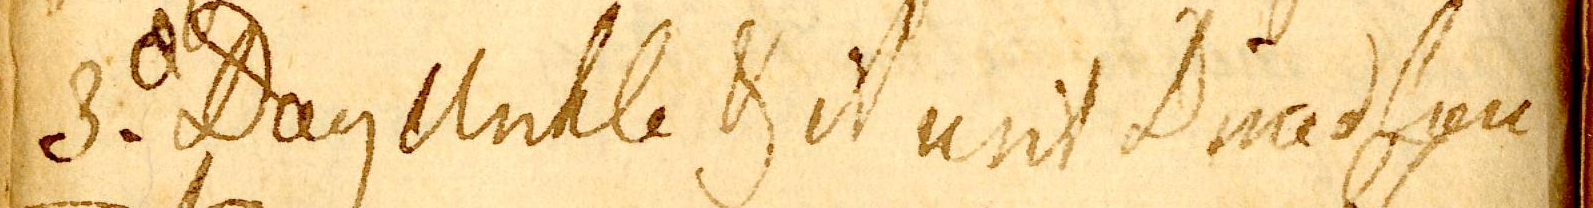3^d. Day Unkle & Aunt Dined here
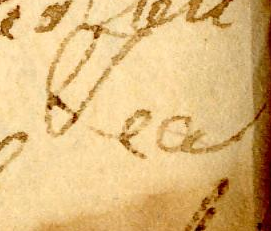Tea
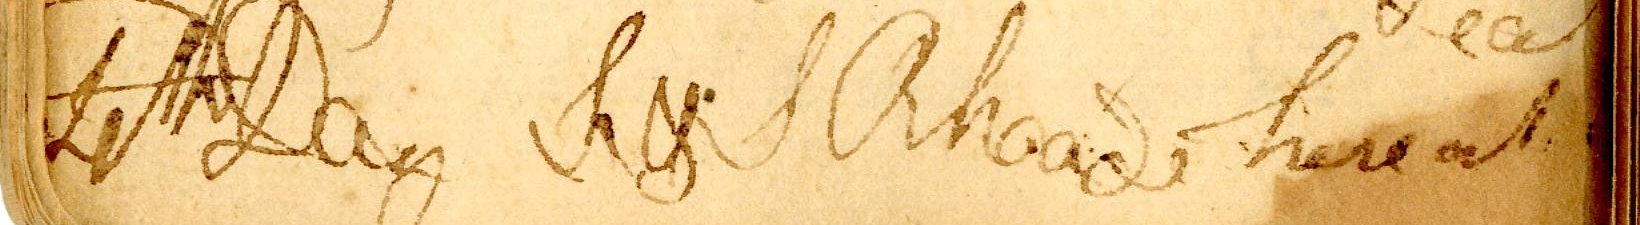4^th Day [S &] S Rhoads here at
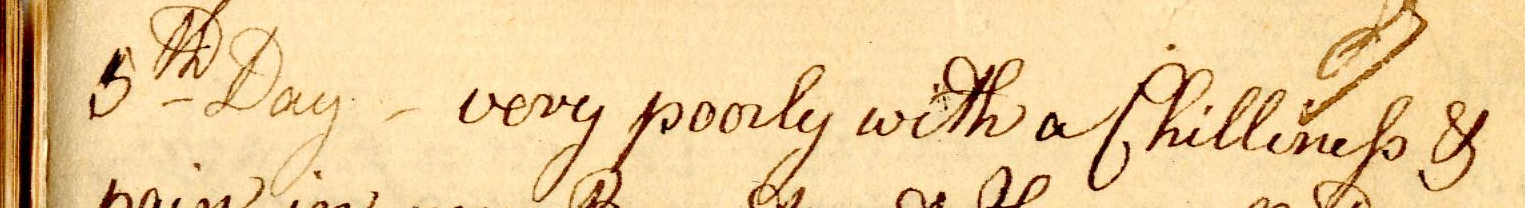5^th Day- very poorly with a Chilliness &
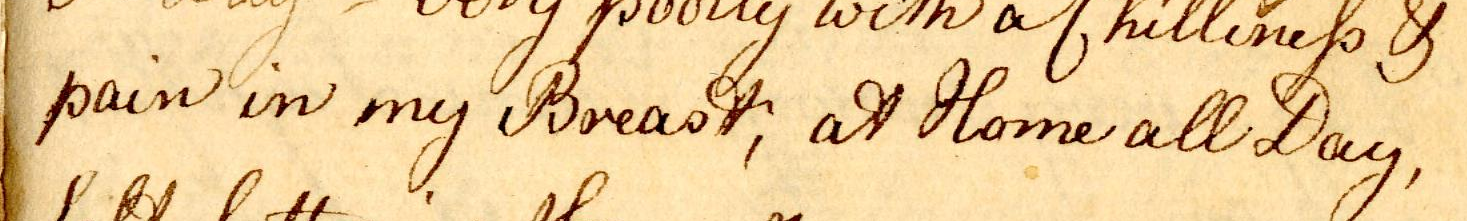pain in my Breast, at Home all Day,
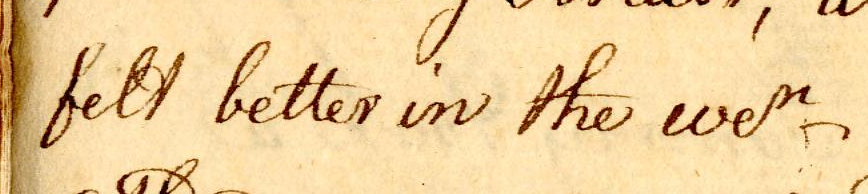felt better in the eve^n
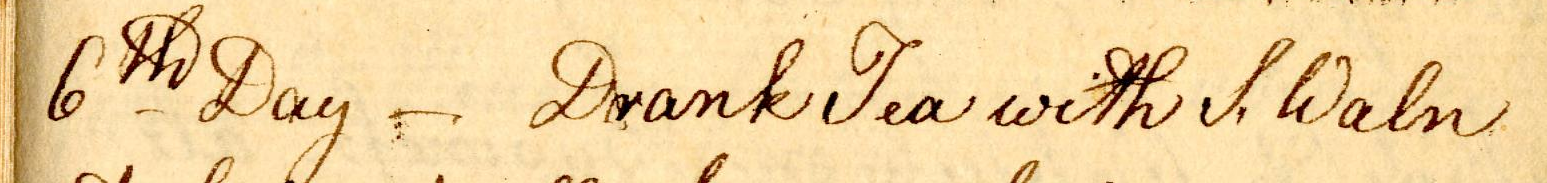6^th Day- Drank Tea with S. Waln
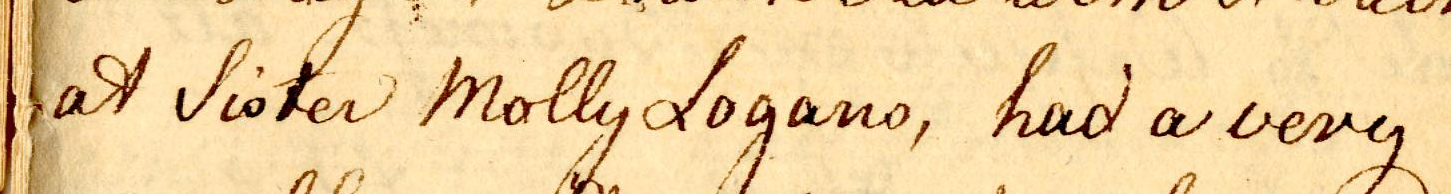at Sister Molly Logans, had a very
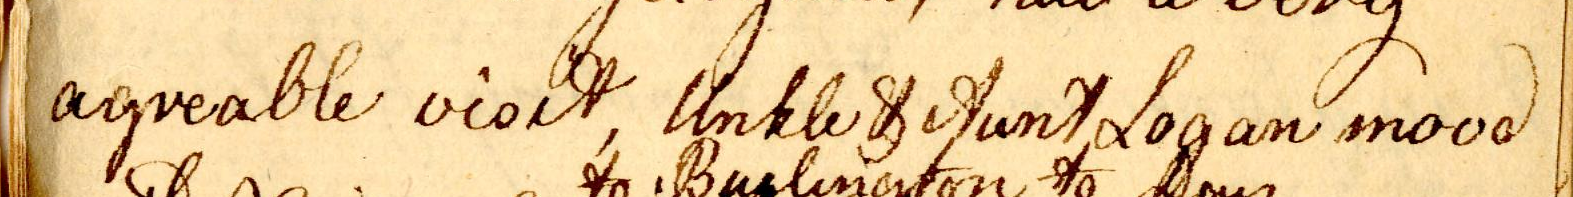agreable visit, Unkle & Aunt Logan movd
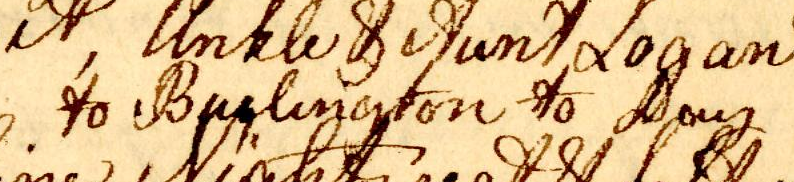to Burlington to Day
